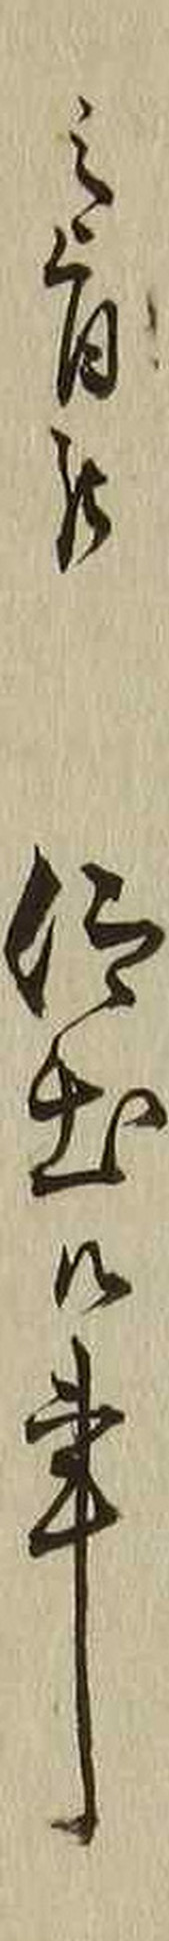之旨被仰出候事
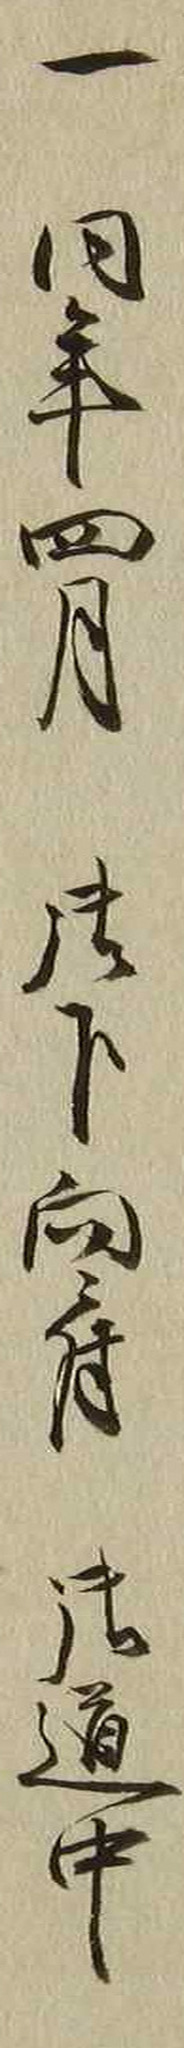一同年四月御下向ニ付御道中
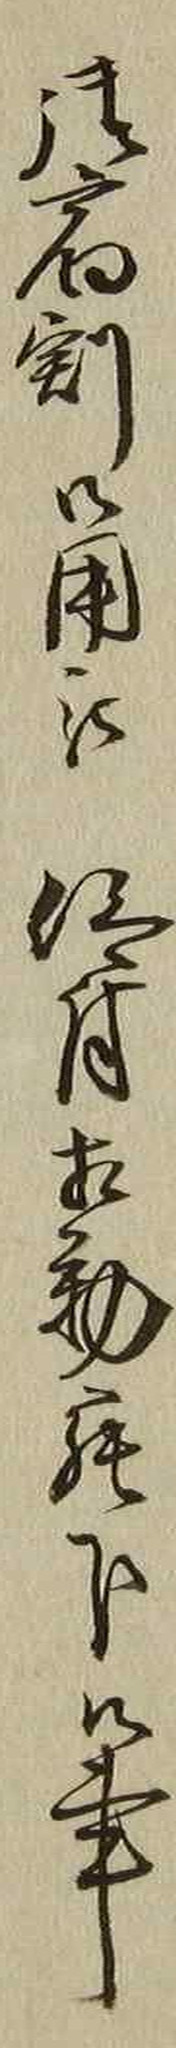御宿割御用被仰付相勤罷下候事
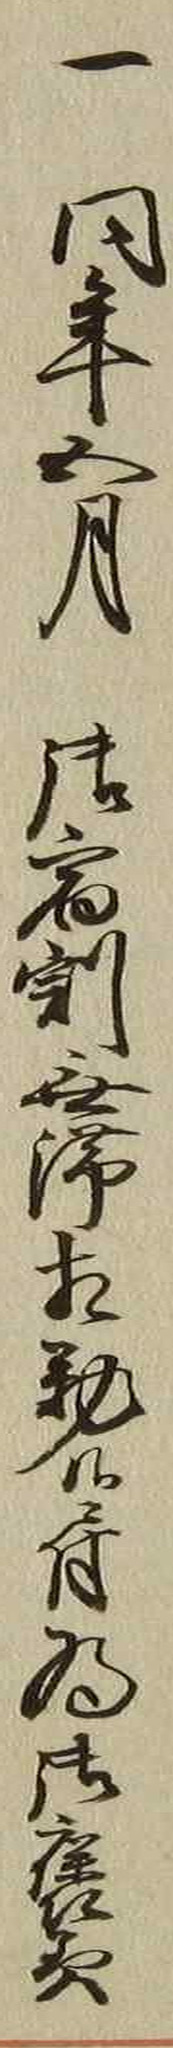一同年五月御宿割無滞相勤候ニ付為御褒美
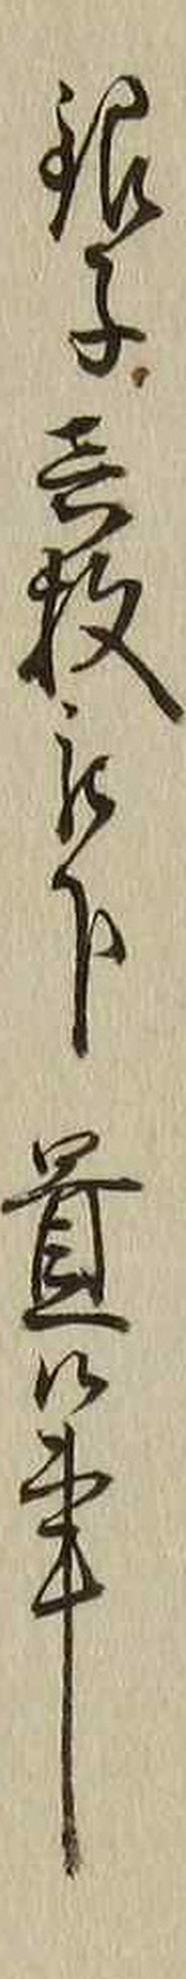銀子壱枚被下置候事
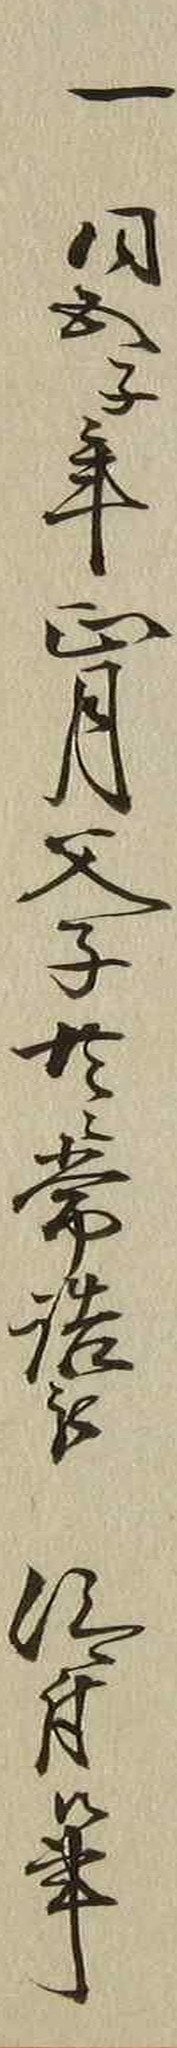一同五子年正月父子共ニ常詰被仰付候事
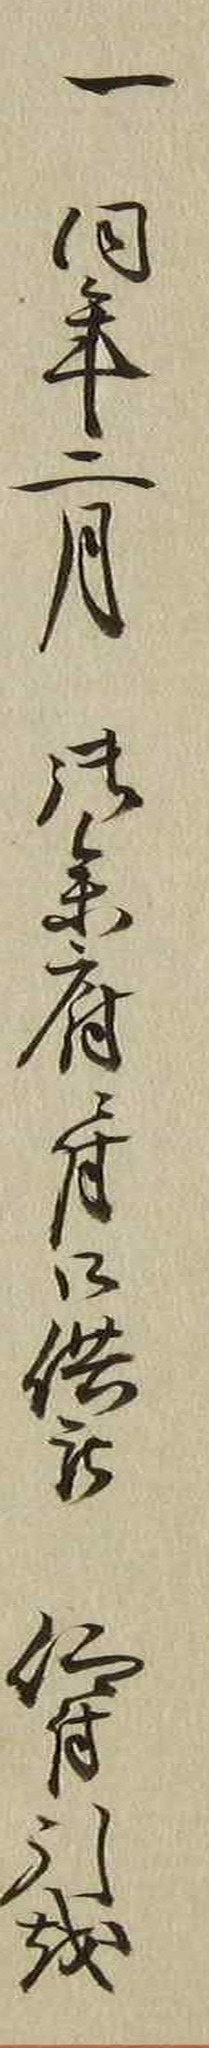一同年二月御参府ニ付御供被仰付引越
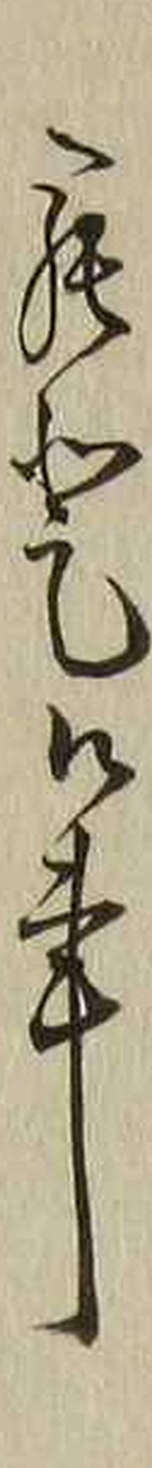罷登候事
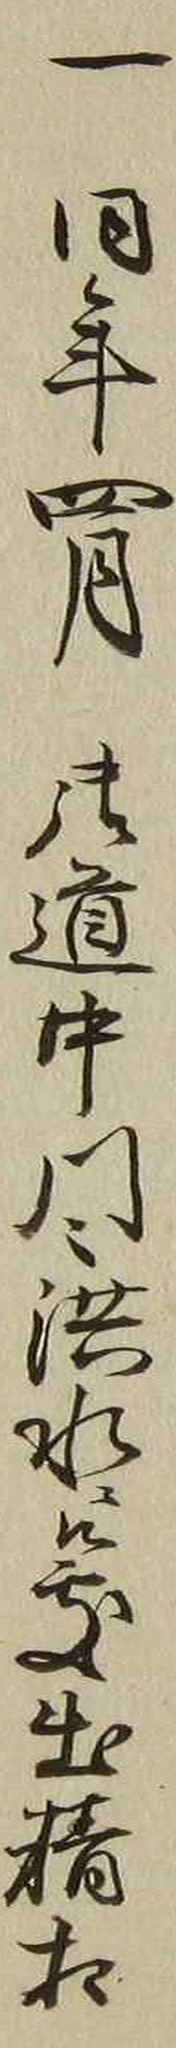一同年四月御道中川々洪水ニ候処出精相
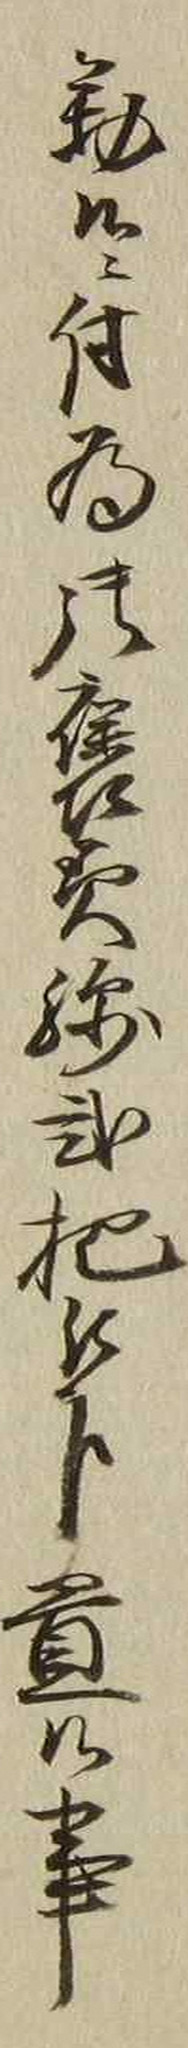勤候ニ付為御褒美綿弐把被下置候事
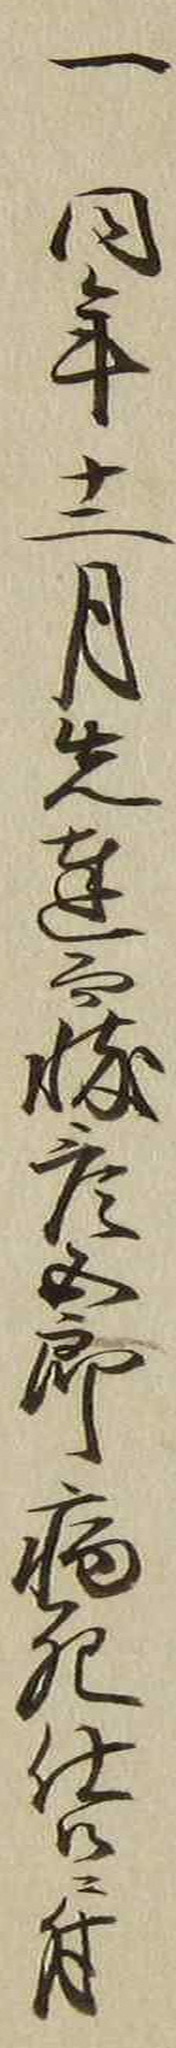一同年十二月先達而忰彦五郎病死仕候ニ付
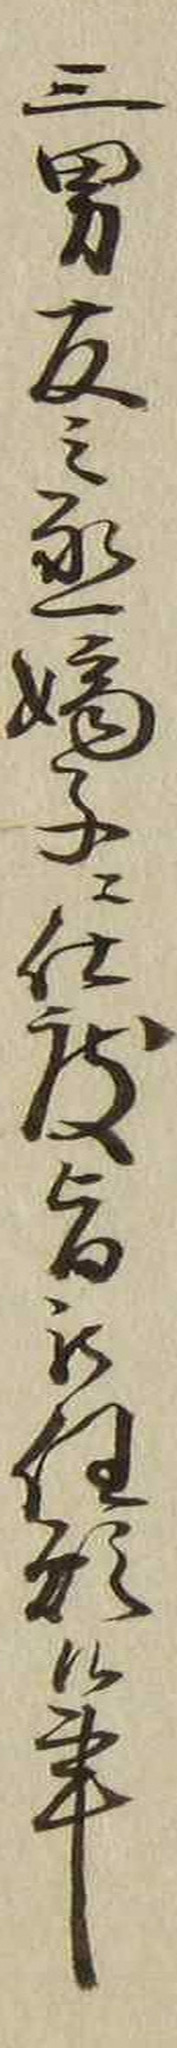三男友之丞嫡子ニ仕度旨被任願候事
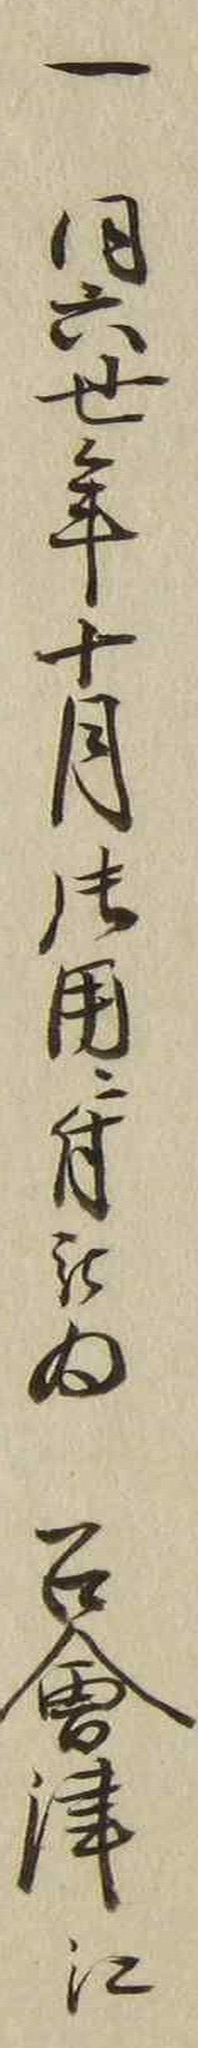一同六丑年十月御用ニ付被為召会津江

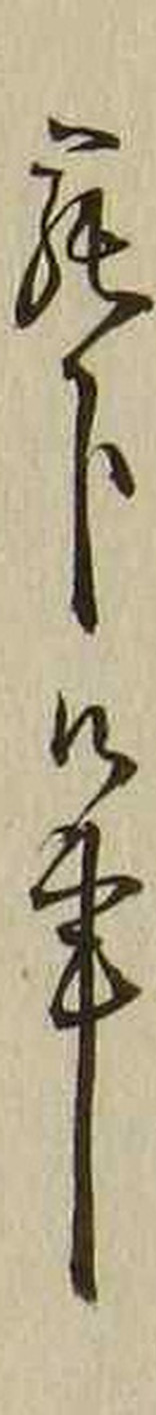罷下候事
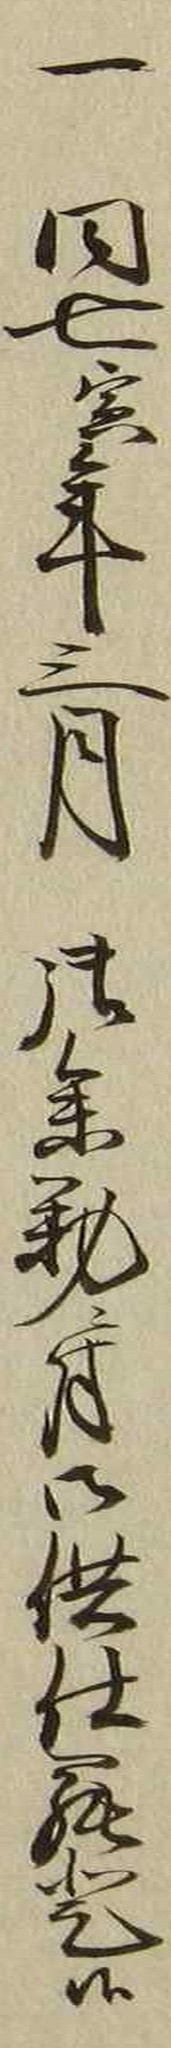一同七寅年三月御参勤ニ付御供仕罷登候
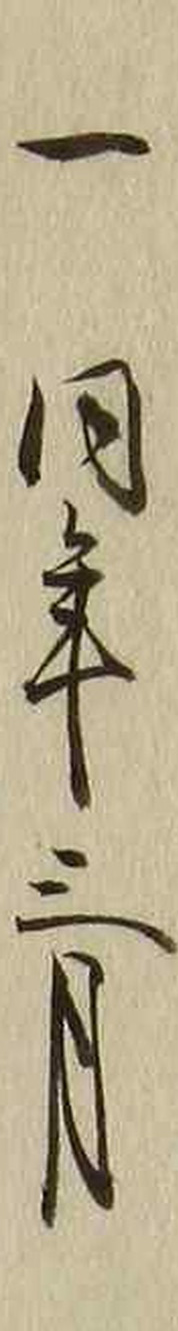一同年三月
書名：諸士系譜　巻之67　を之部1
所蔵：会津若松市立会津図書館
